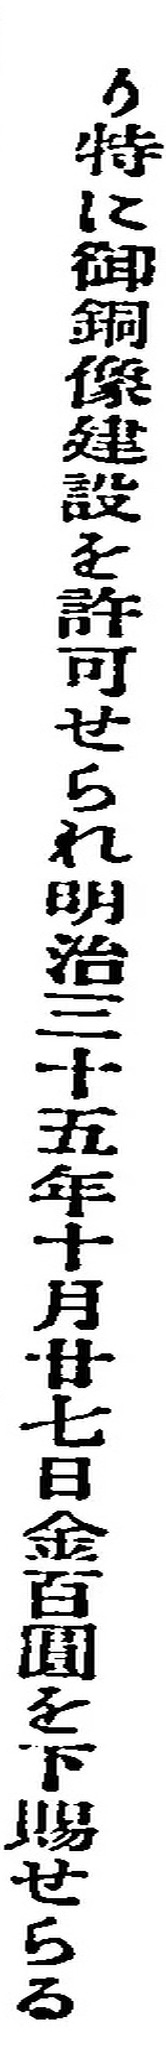り特に御銅像建設を許可せられ明治三十五年十月廿七日金百圓を下賜せらる
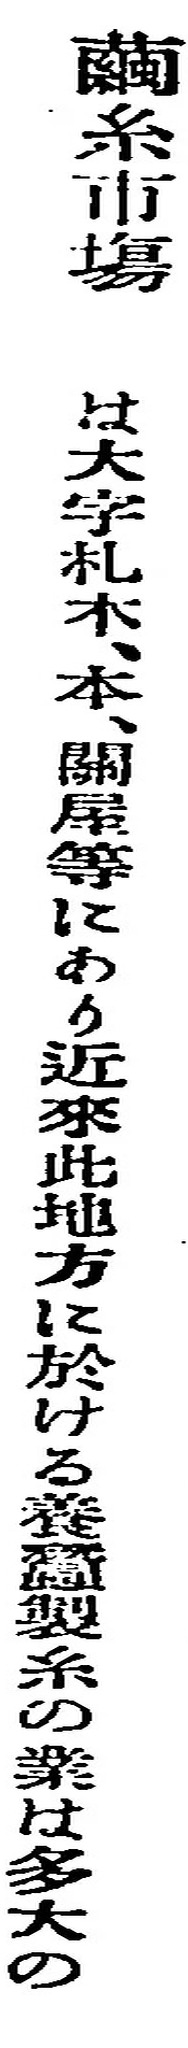繭糸市場は大字札木、本、關屋等にあり近來此地方に於ける養蠶製糸の業は多大の
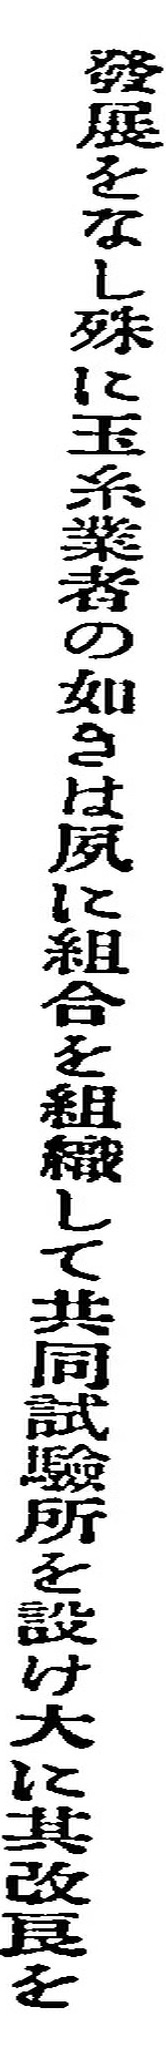發展をなし殊に玉糸業者の如きは夙に組合を組織して共同試驗所を設け大に其改良を
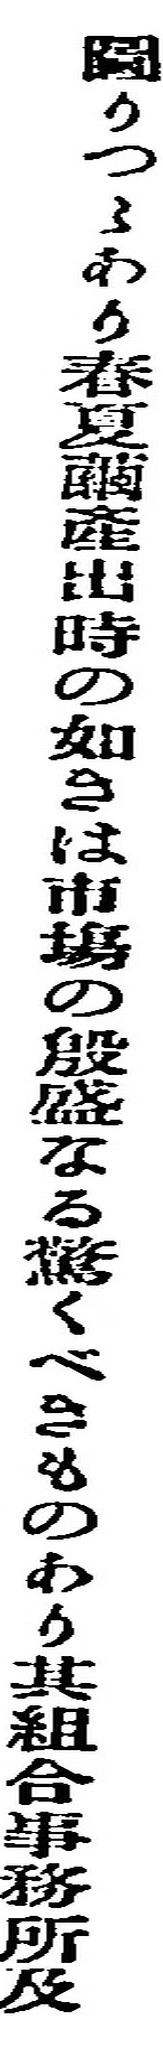圖りつゝあり春夏繭產出時の如きは市場の殷盛なる驚くべきものあり其組合事務所及
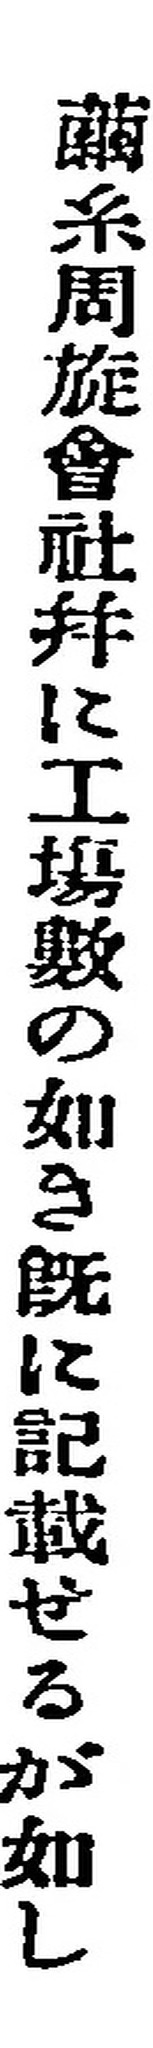繭糸周旋會社幷に工場數の如き旣に記載せるが如し
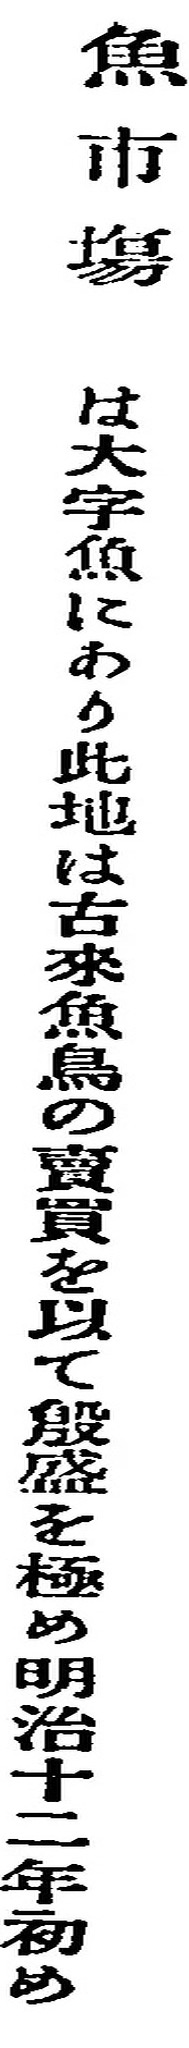魚市場は大字魚にあり此地は古來魚鳥の賣買を以て殷盛を極め明治十二年初め
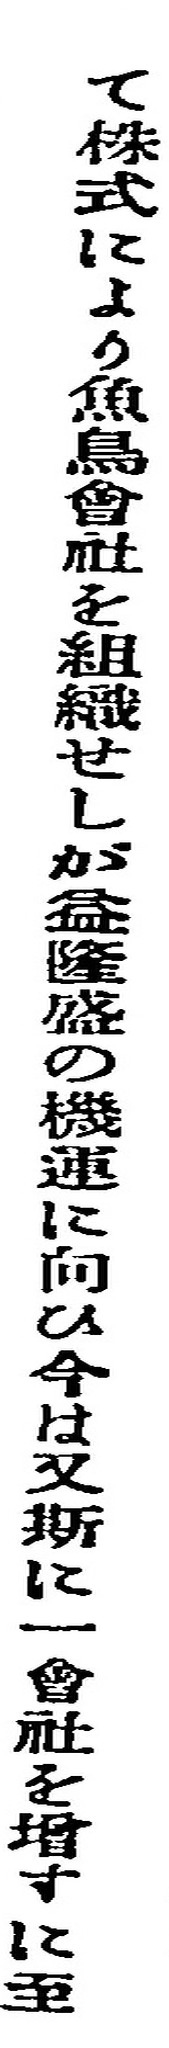て株式により魚鳥會社を組織せしが益隆盛の機運に向ひ今は又斯に一會社を增すに至
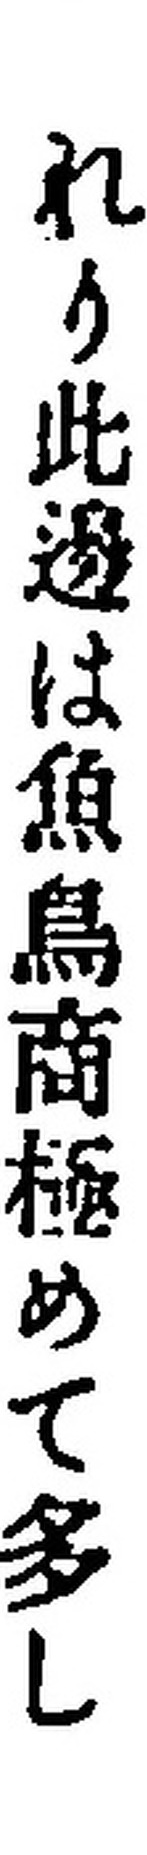れり此邊は魚鳥商極めて多し
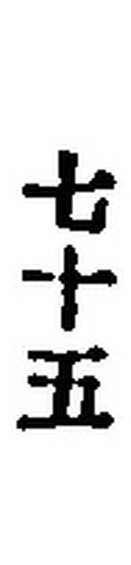七十五

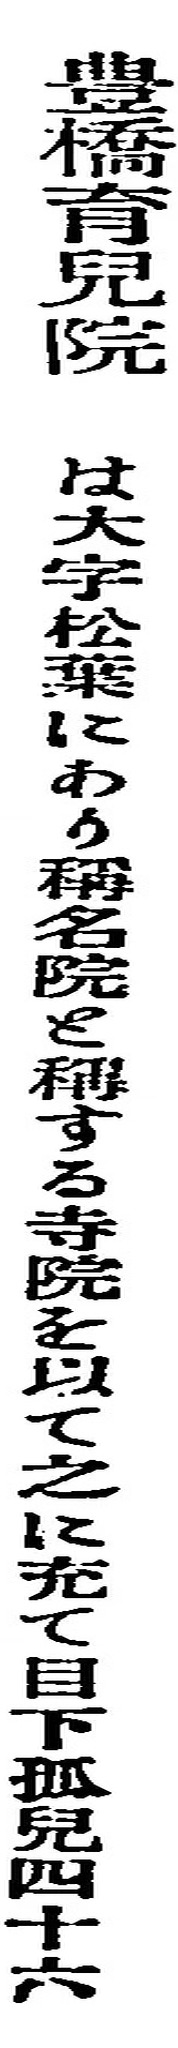豊橋育兒院は大字松葉にあり稱名院と稱する寺院を以て之に充て目下弧兒四十六
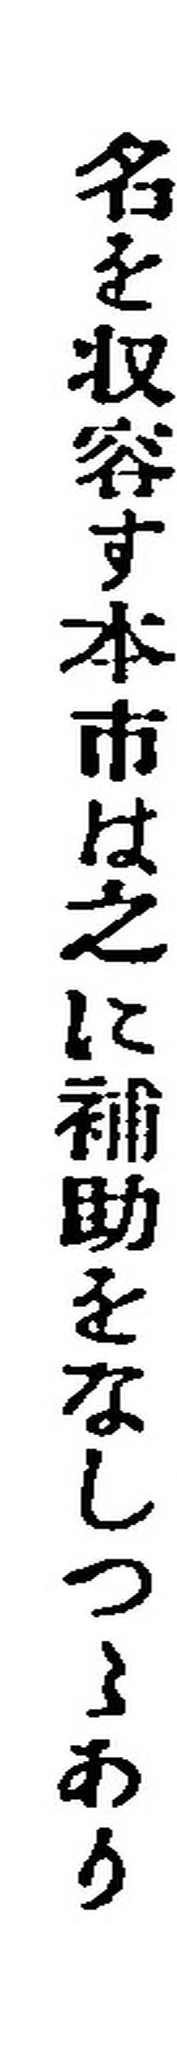名を収容す本市は之に補助をなしつゝあり
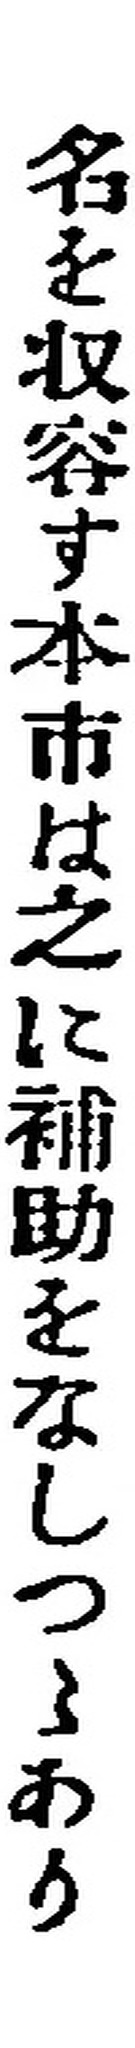名を収容す本市は之に補助をなしつゝあり
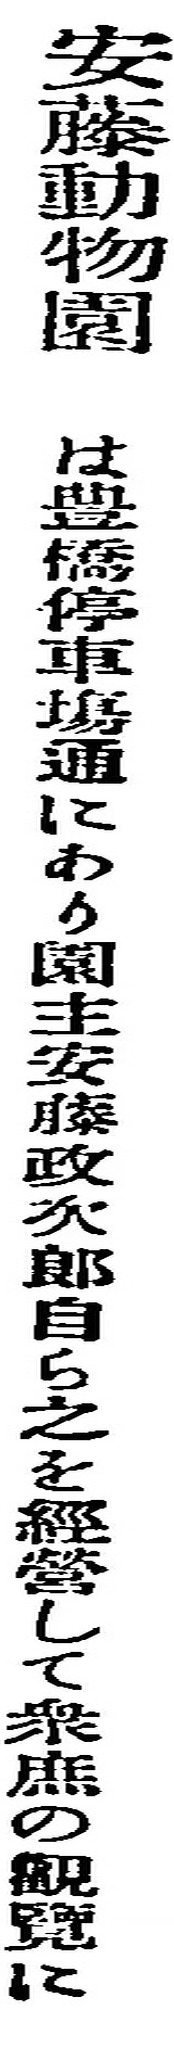安藤動物園は豊橋停車場通にあり圓主安藤政次郞自ら之を經營して衆庶の觀覧に
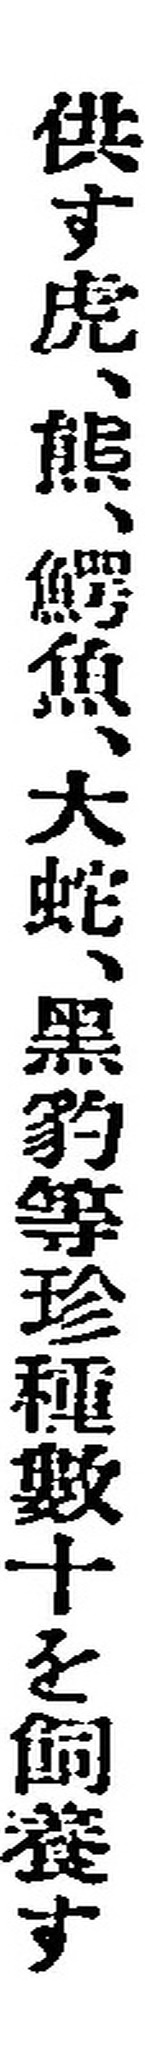供す虎、熊、鰐魚、大蛇、黑豹等珍種數十を飼養す
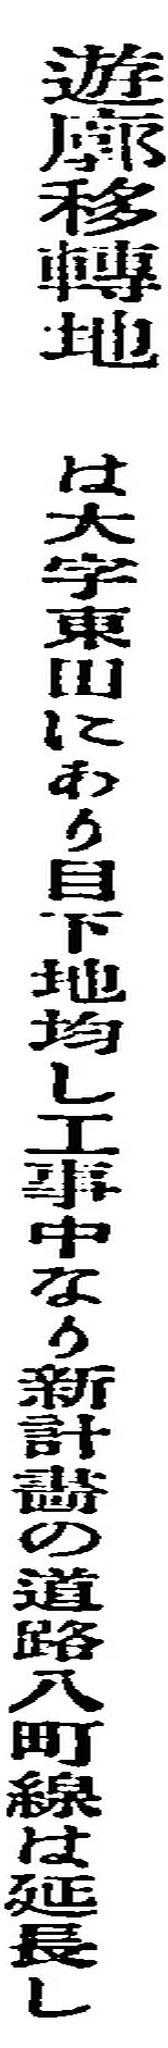遊廓移轉地は大字東山にあり目下地均し工事中なり新計畵の道路八町線は延長し
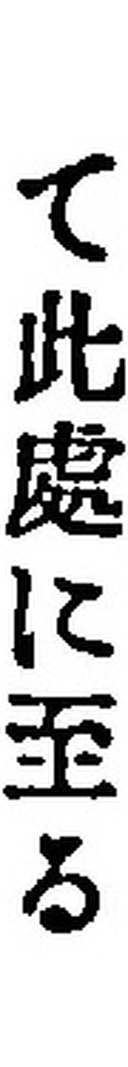て此處に至る
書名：豊橋志要
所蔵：国立国会図書館 National Diet Library, JAPAN
